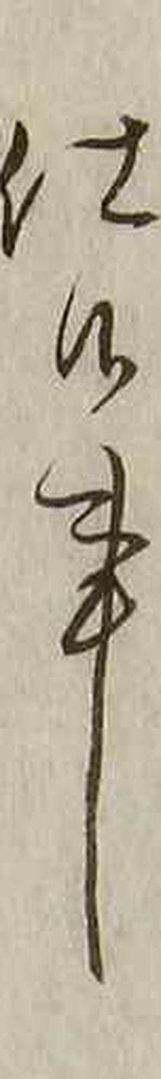仕候事
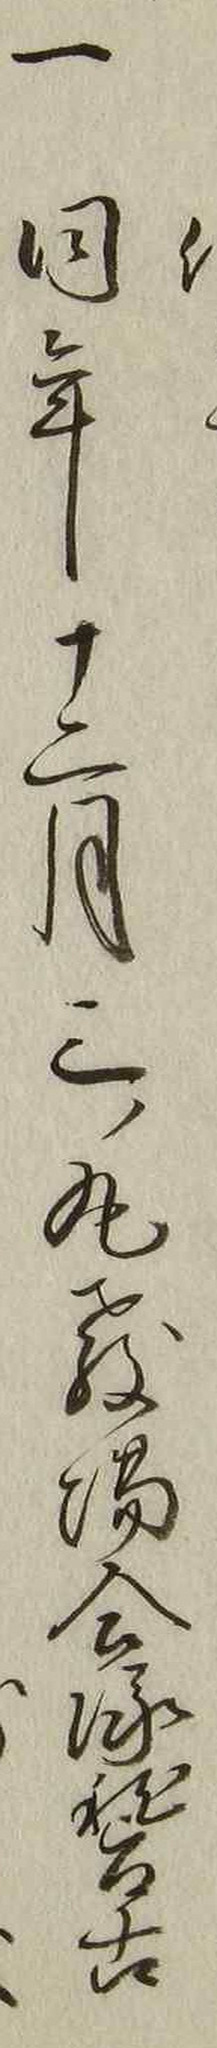一同年十二月三之丸教場合隊稽古
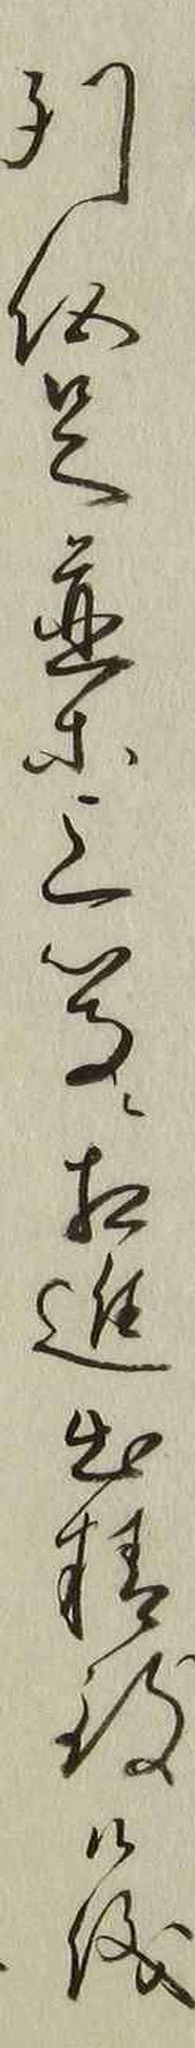列伍足並等上等に相進出精致候儀
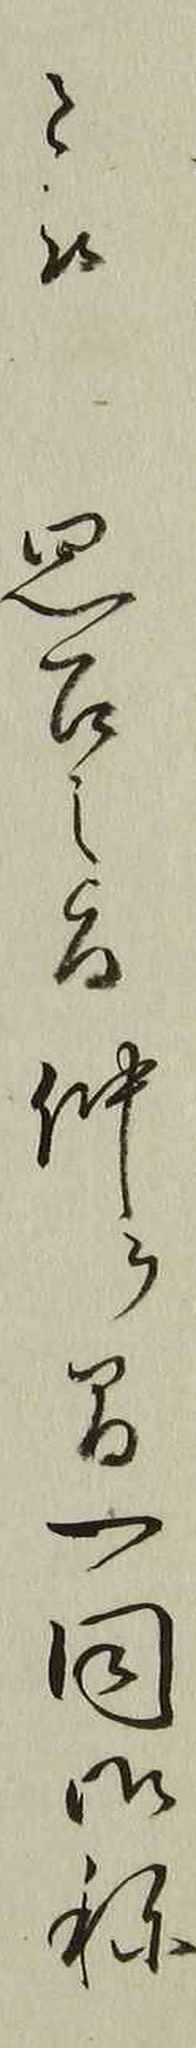と被思召之旨仲ヶ間一同御称
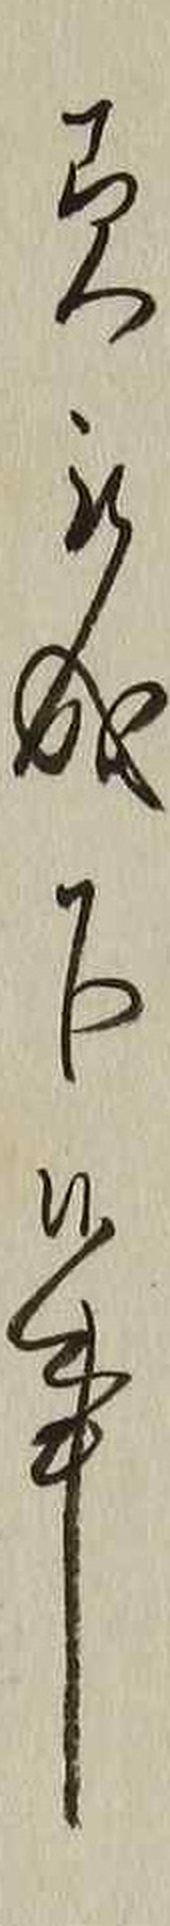美被成下候事
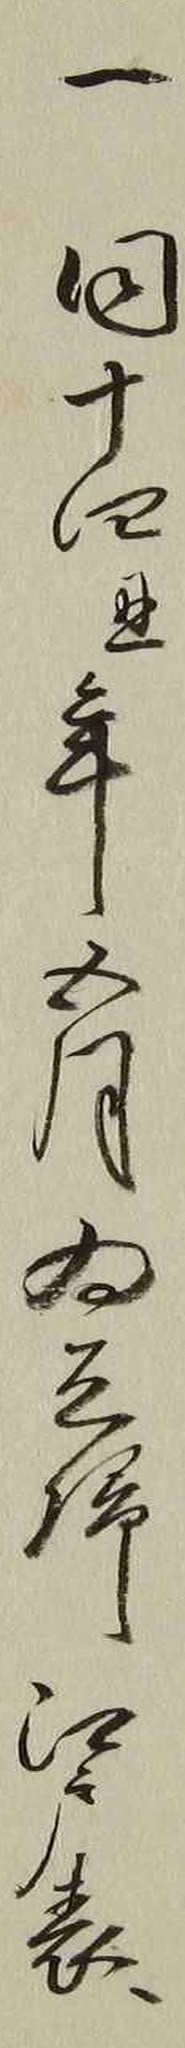一同十四丑年五月為立帰江戸表へ
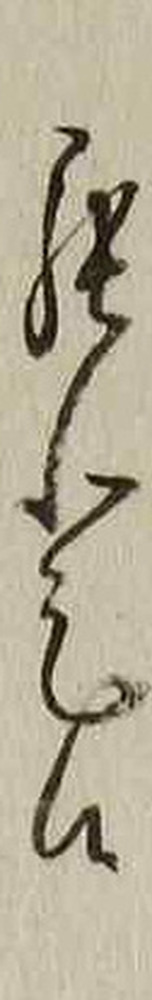罷登候
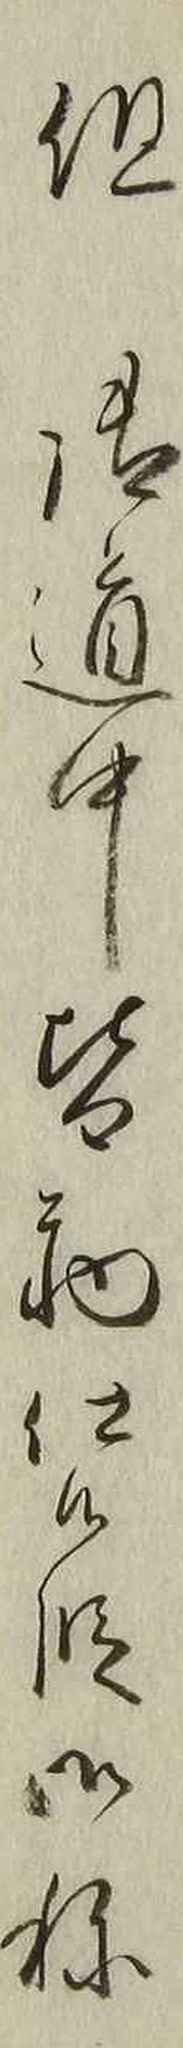但御道中皆勤仕候段御称
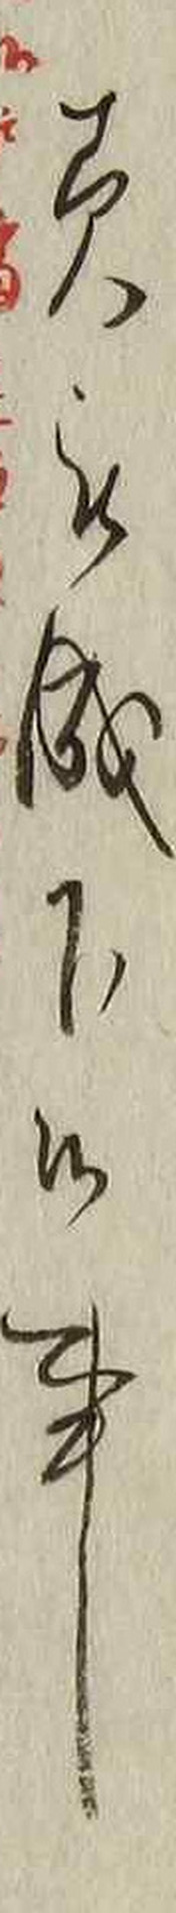美被成下候事
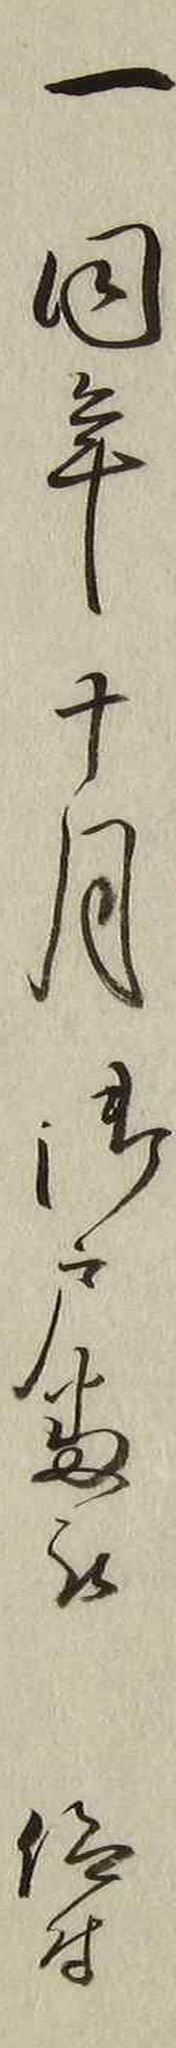一同年十月御戸番被仰付
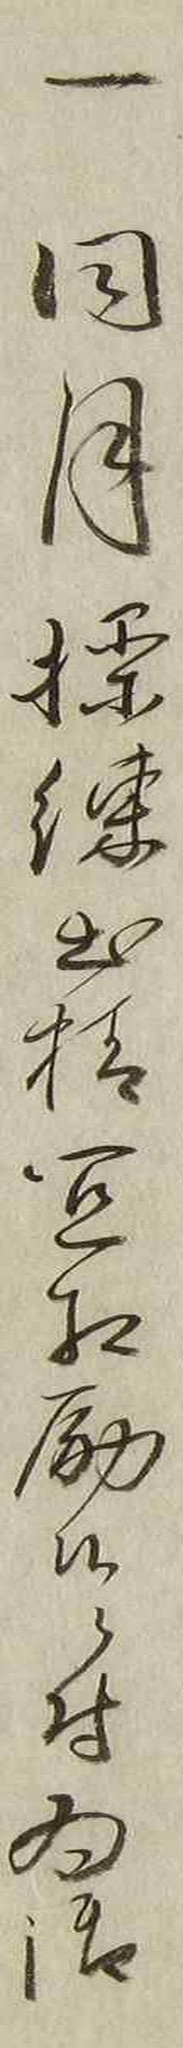一同月操練出精宜相励候に付為御
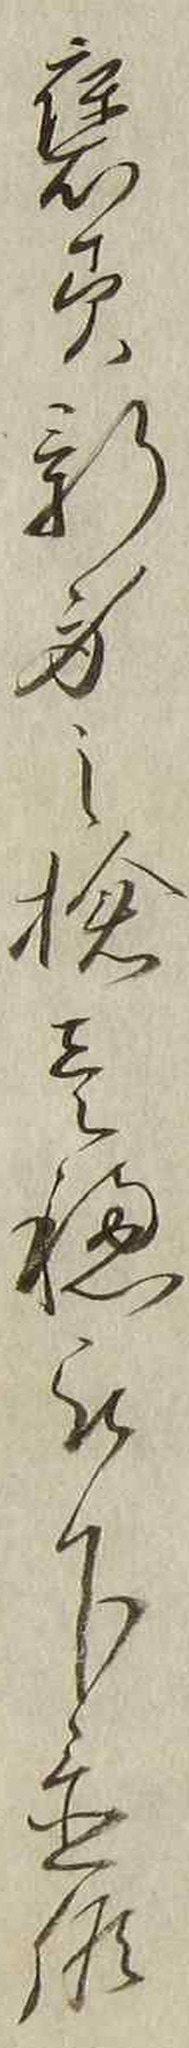褒美新身之槍壱穂被下置候

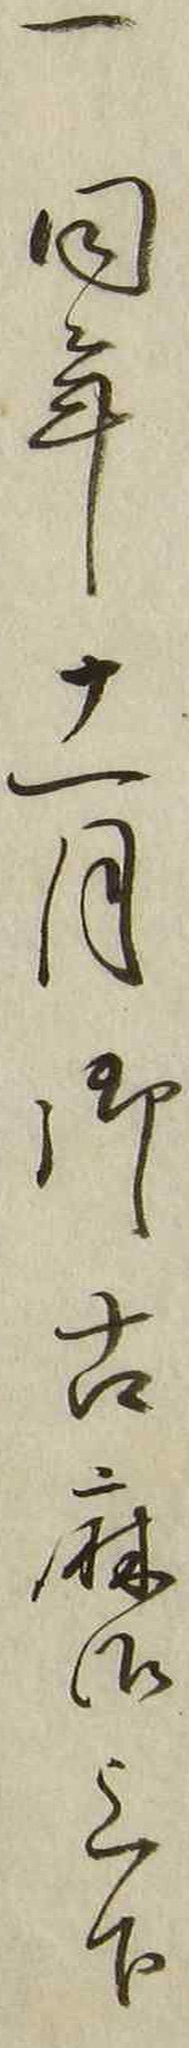一同年十一月御古麻御上下
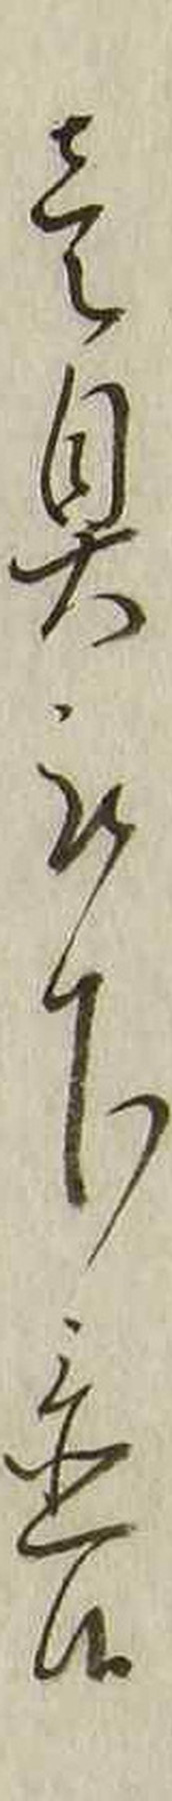壱具被下置候
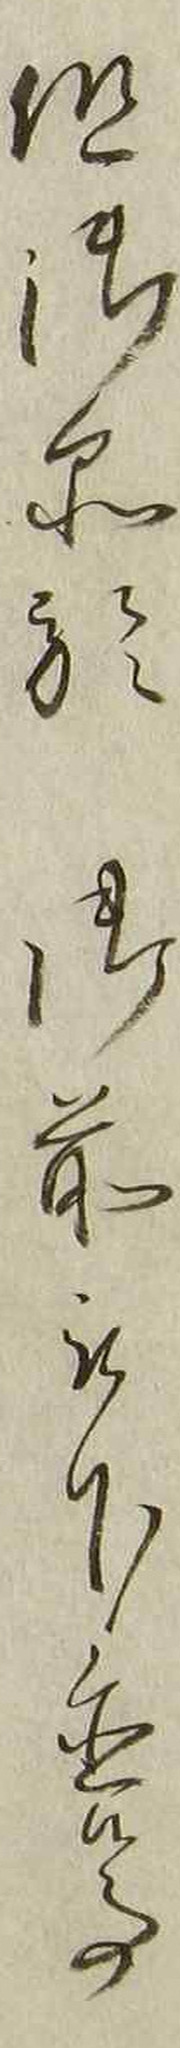但御品於御前被下置候事
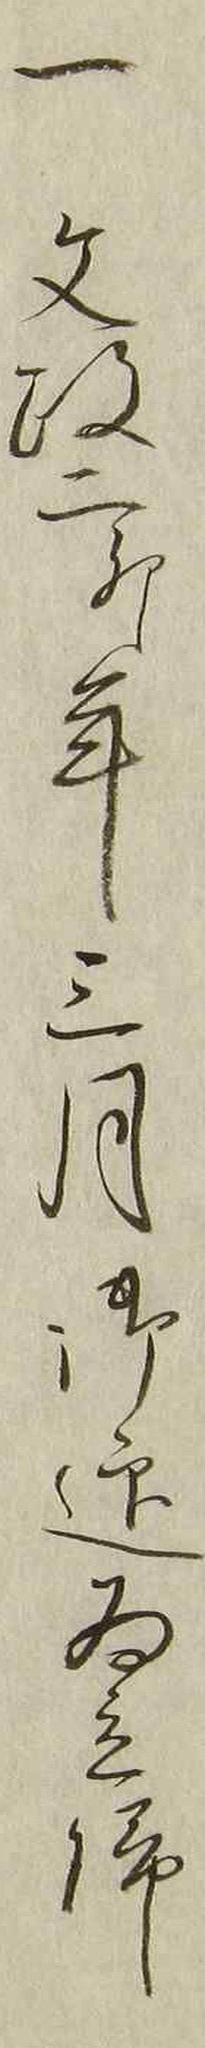一文政二卯年三月御迎為立帰
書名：諸士系譜　巻之6　い之部6
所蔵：会津若松市立会津図書館
